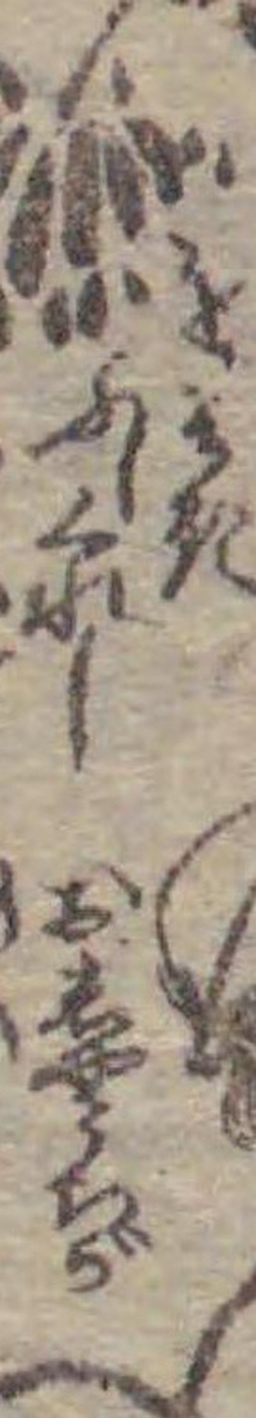おしやうちが
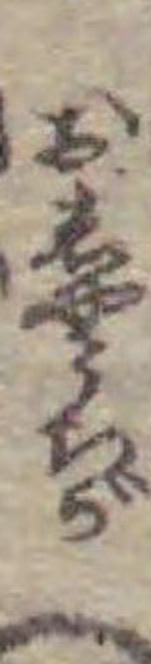おしやうちが
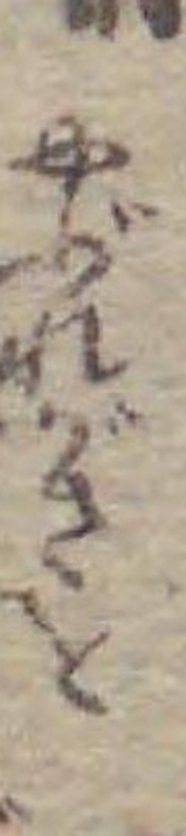やぶれがさを
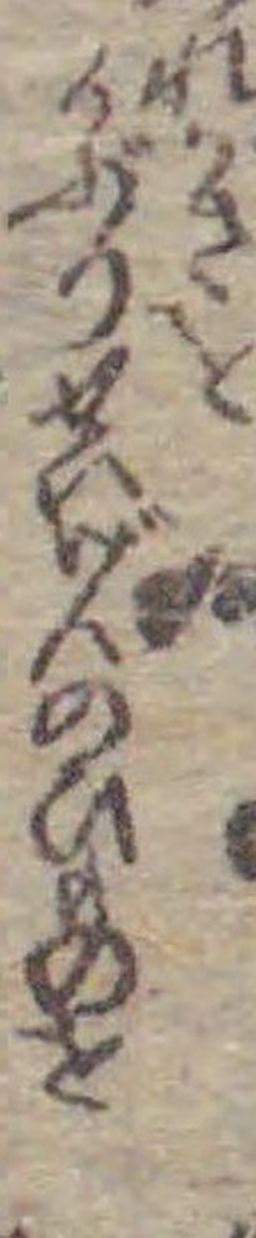かぶりせいげんのひものを
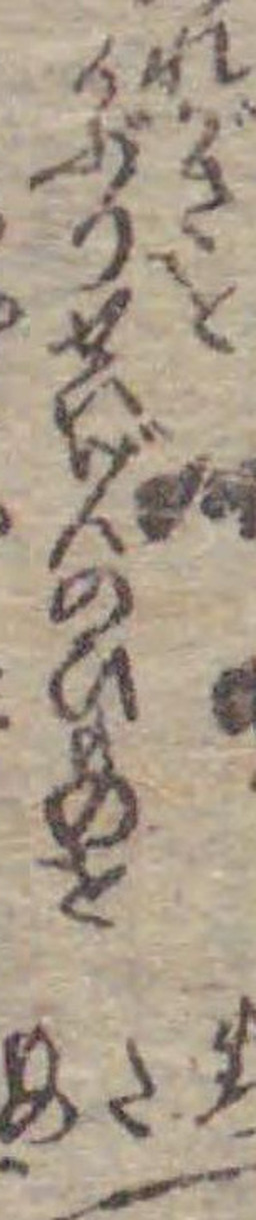かぶりせいげんのひものを
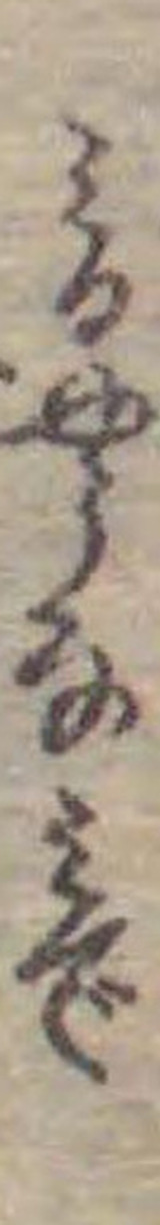みるやうなみで
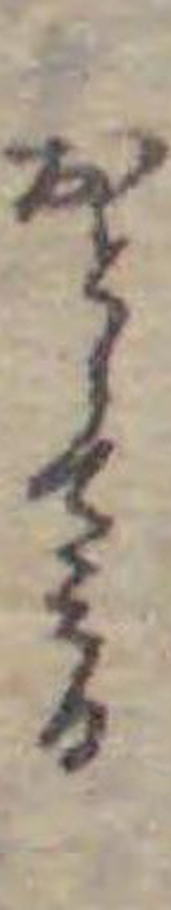おとしてみる
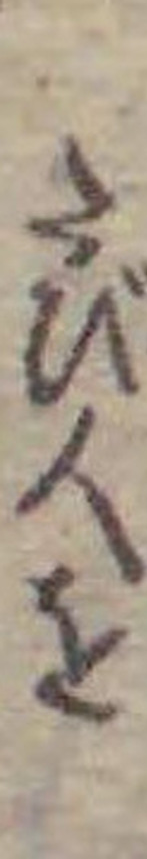たび人を

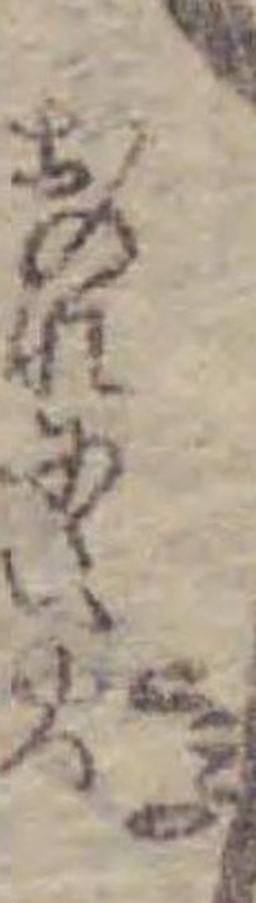おのれにくいやつ
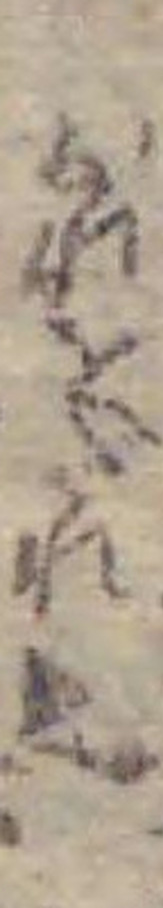おれをたれ
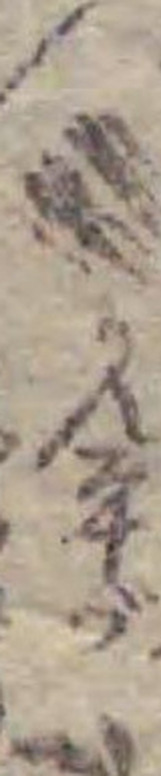かん平が
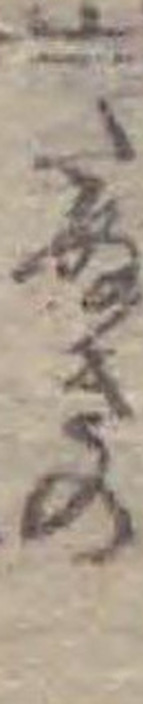たぬきの
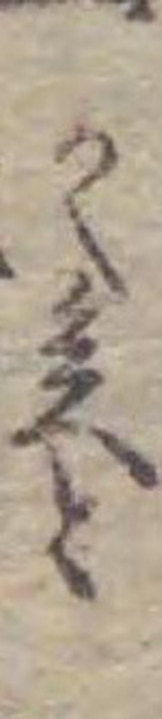かく兵へと
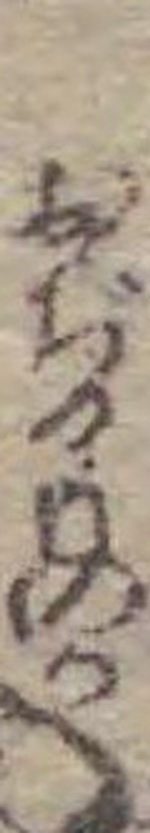おぢるものか
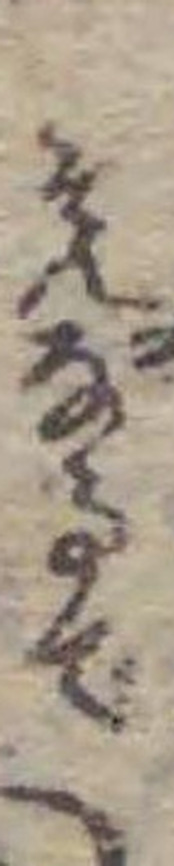そんな事で
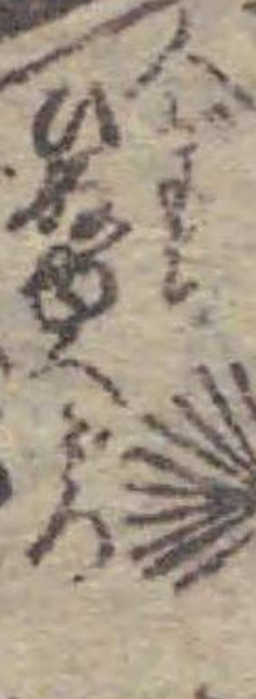ひぬゆへみつ
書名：[化物一代記] : 5巻
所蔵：国立国会図書館 National Diet Library, JAPAN
